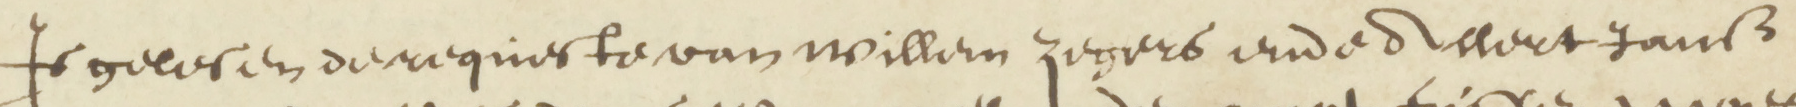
Is gelesen de requeste van willem zegers ende Allert Jansz
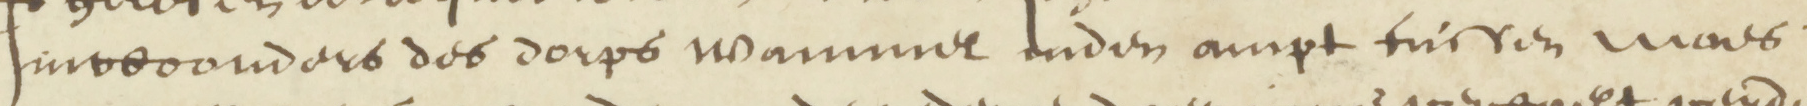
inwoonders des dorps Wammel inden ampt tussen Maes
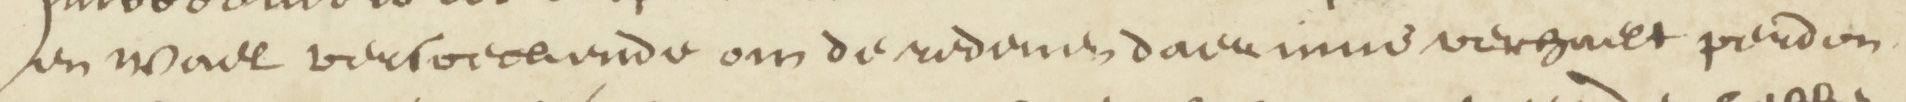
ende Wael versoeckende om de redenen daerinne verhaelt perden
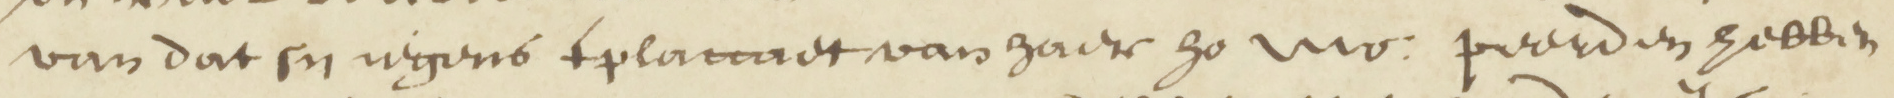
van dat sy iegens tplaccaet van haer hoMo: peerden hebben
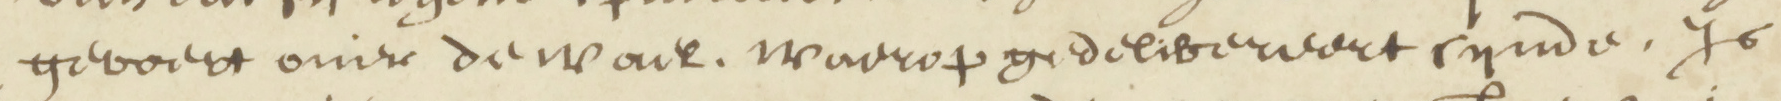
gevoert ouer de Wael. Waerop gedelibereert synde, Is
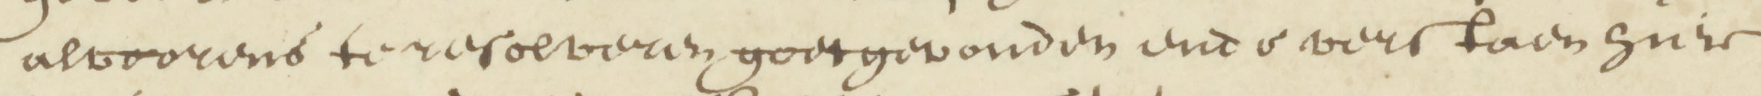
alsvoorens te resolveren goetgevonden ende verstaen hier
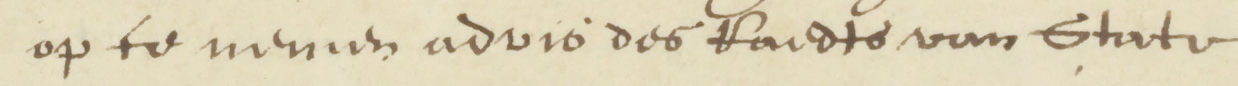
op te nemen advis des Raedts van State.
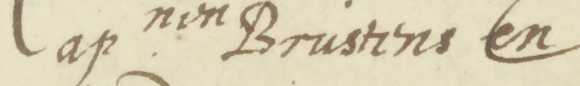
Capnen Brustens en
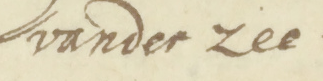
vander zee.
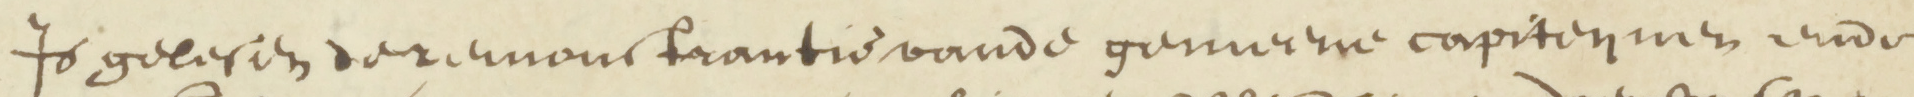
Is gelesen de remonstrantie vande gemeene capiteynen ende
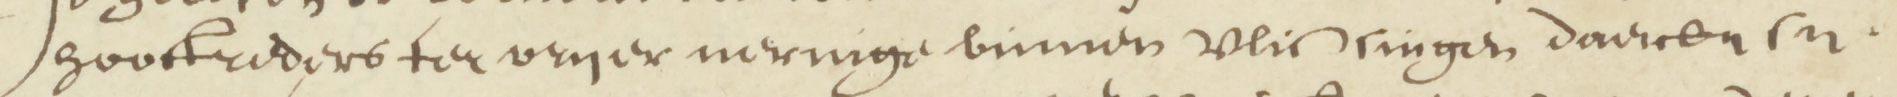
hooftreders ter vryer neringe binnen Vlissingen daerby sy
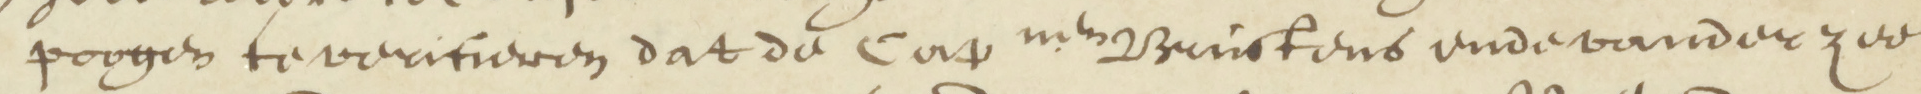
poogen te verifieren dat de Capnen. Brustens ende vander zee
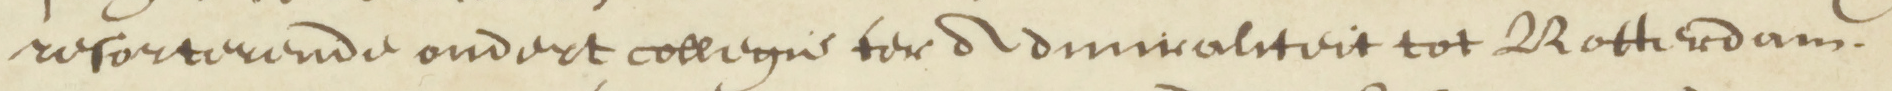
resorterende ondert collegie ter Admiraliteit tot Rotterdam
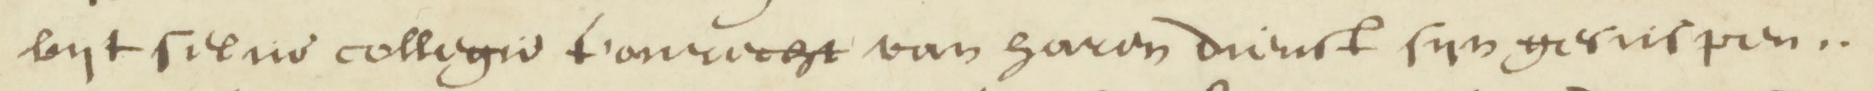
vyt selue collegie t‛onrecht van haren dienst syn gesuspen„
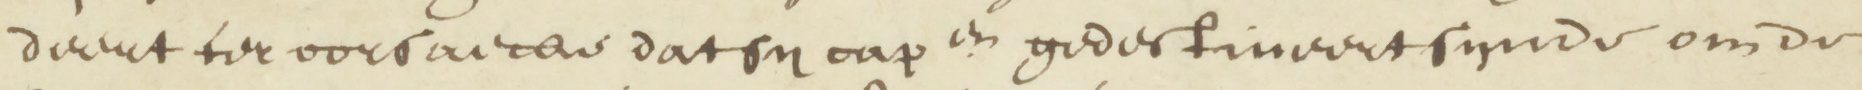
deert ter oorsaecke dat sy capen. gedestineert synde om de
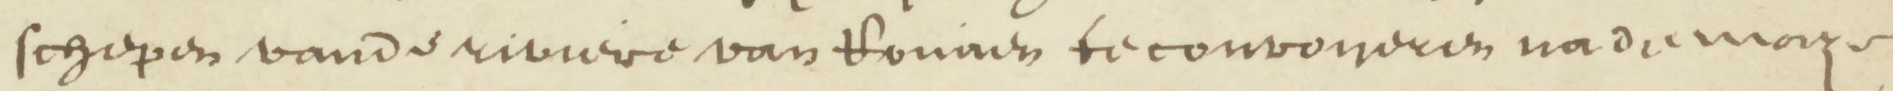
schepen vande riviere van Rouaen te convoyeren na de Maze
